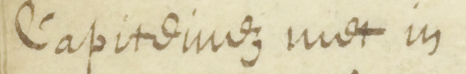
Capiteinen niet in
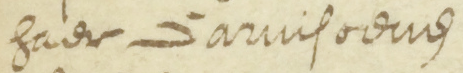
haer Garnisoenen
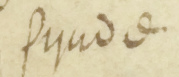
synde
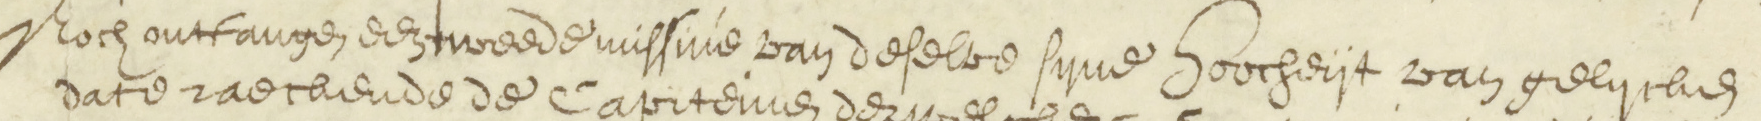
Noch ontfangen een tweede missiue van deselve syne Hoocheijt van gelycken
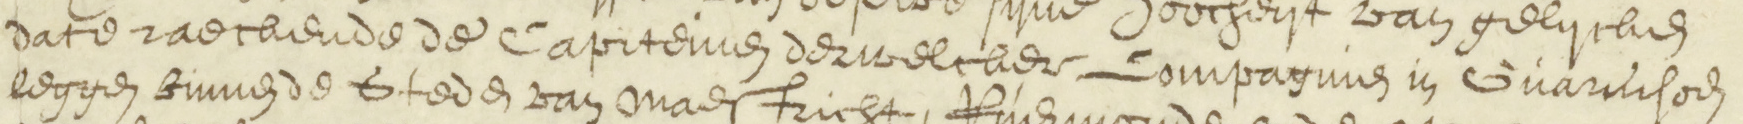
date raeckende de Capiteinen derwelcker Compagnien in Guarnisoen
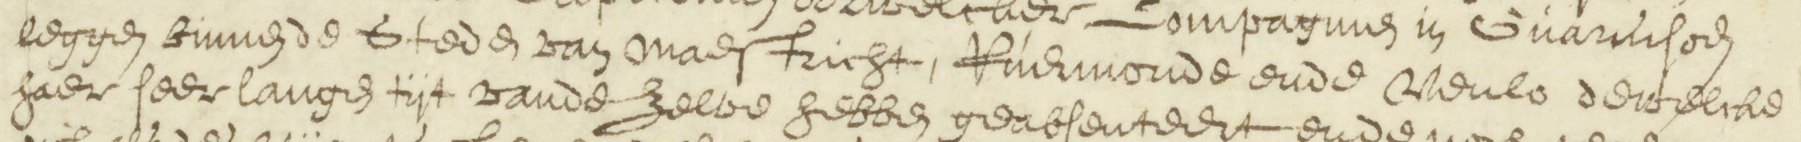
leggen binnen de Steden van maestricht, Ruermonde ende Venlo dewelcke
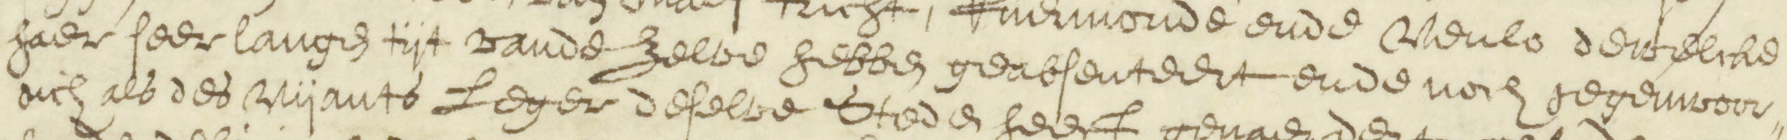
haer seer langen tijt vande zelve hebben geabsenteert ende noch jegenwoor„
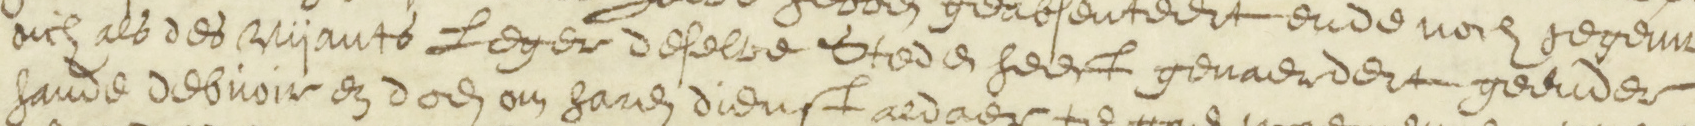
dich als des vijants Leger deselve Steden heeft genaerdert geender
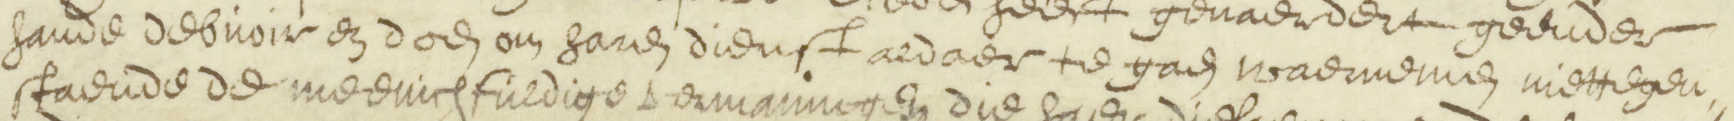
hande debuoir en doen om haren dienst aldaer te gaen waernemen niettegen„
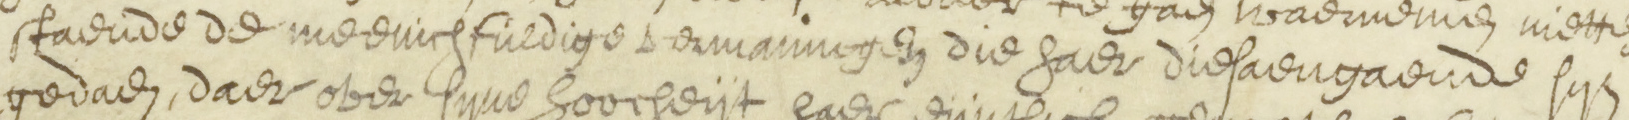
staende de meenichfuldige vermaningen die haer diesaengaende syn
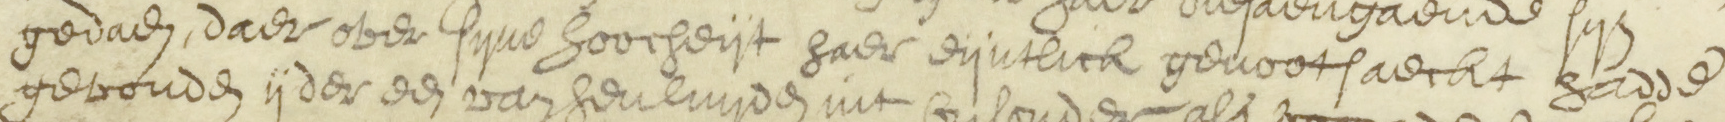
gedaen, daer over syne hoocheijt haer eijntlick genootsaeckt hadde
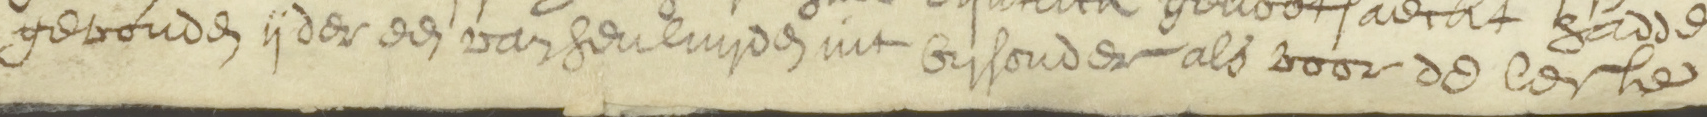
gevonden ijder een van henluyden int bysonder als voor de leste
